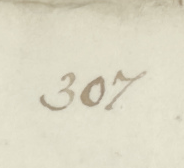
307
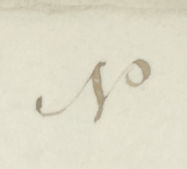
N
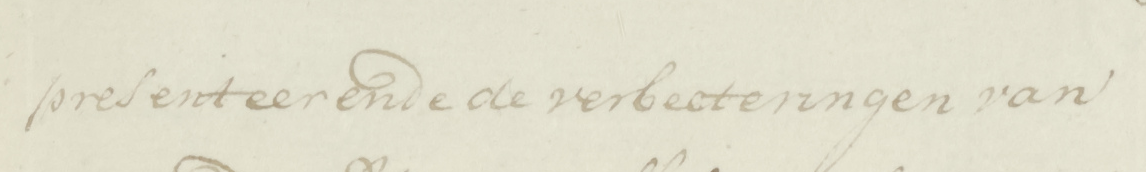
presenteerende de verbeeteringen van
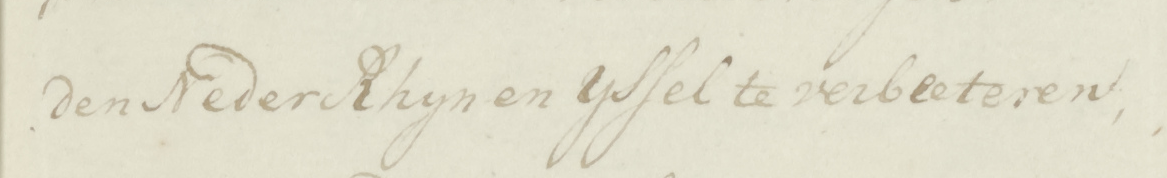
den NederRhyn en Yssel te verbeeteren,
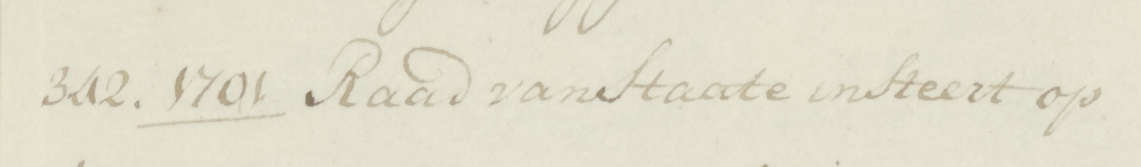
342. 1701 Raad van Staate insteert op
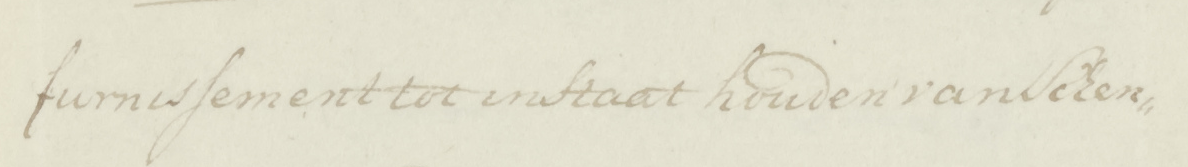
furnissement tot instaat houden van schen,,
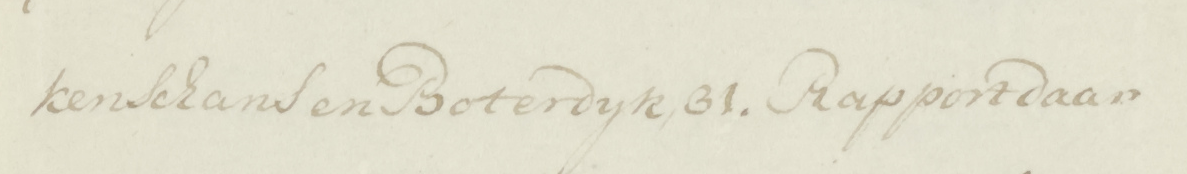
kenschans en Boterdyk, 31. Rapport daar
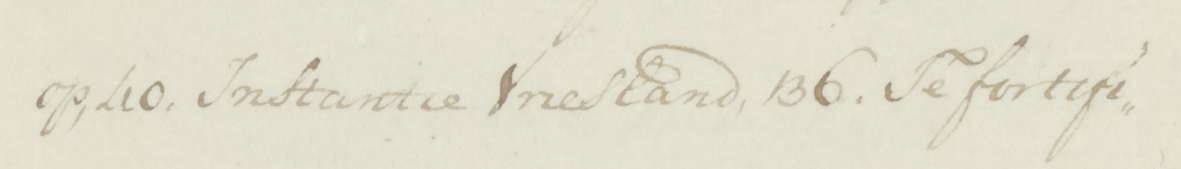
op, 40. Instantie Vriesland, 136. Te fortifi„
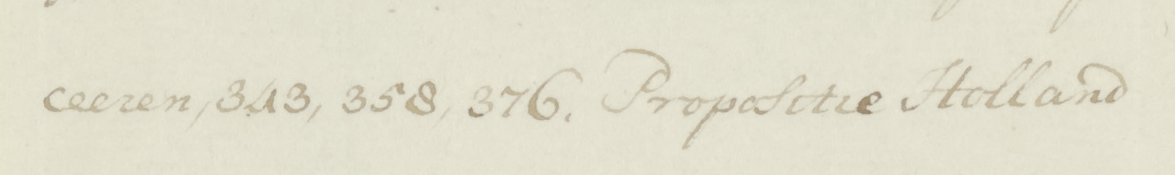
ceeren, 343, 358, 376. Propositie Holland
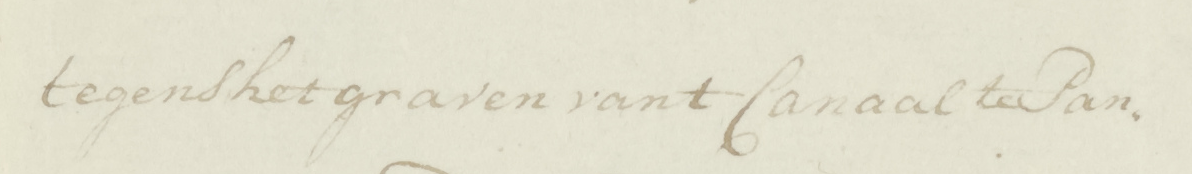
tegens het graven vant Canaal te Pan,,
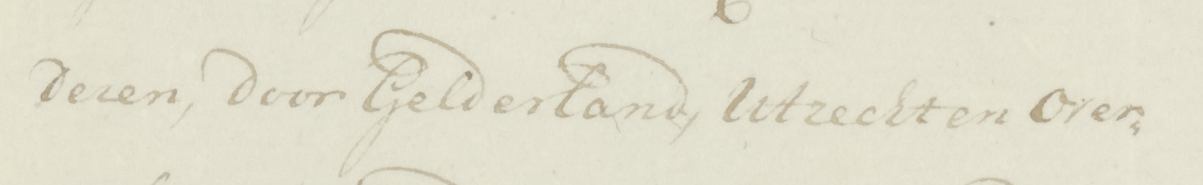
deren, door Gelderland, Utrecht en Over„
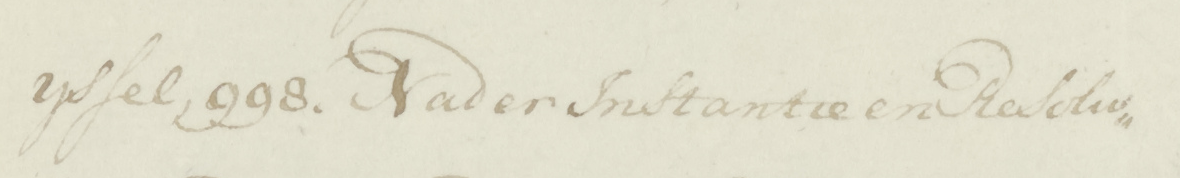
yssel, 998. Nader Instantie en Resolu„
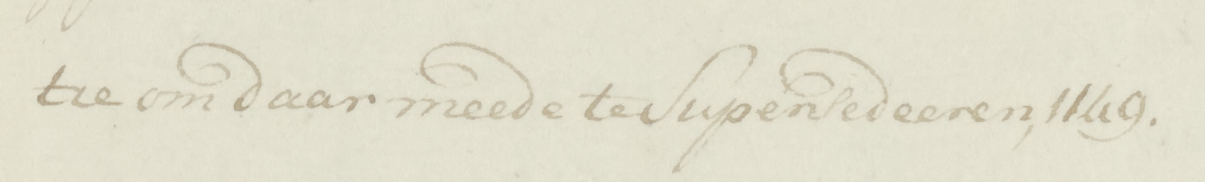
tie om daar meede te Supersedeeren 1149.
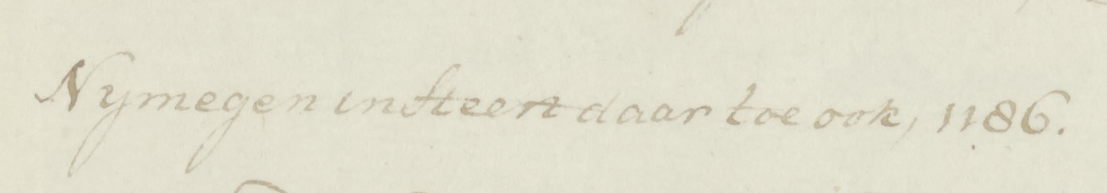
Nymegen insteert daar toe ook, 1186.
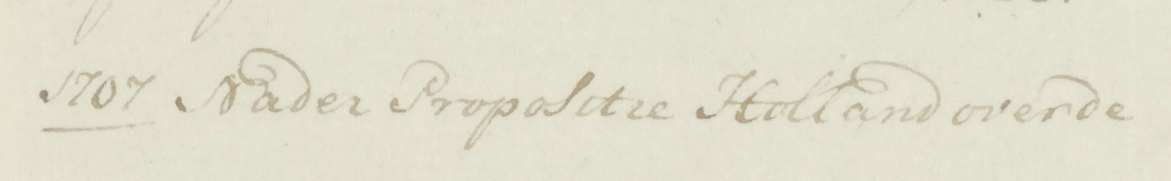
1707 Nader Propositie Holland over de
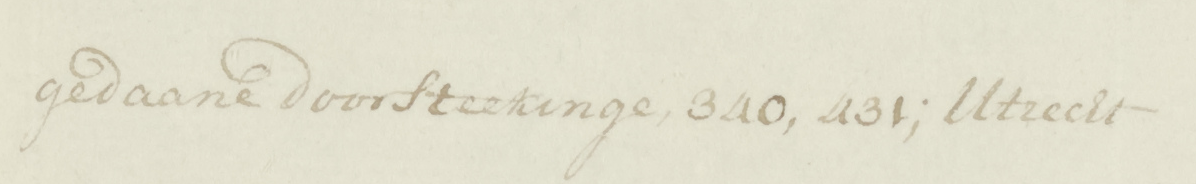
gedaane doorsteekinge, 340, 431; Utrecht
